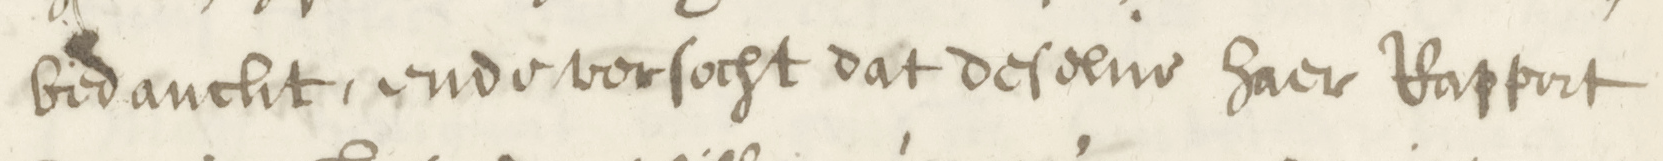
bedanckt, ende versocht dat deselue haer Rapport
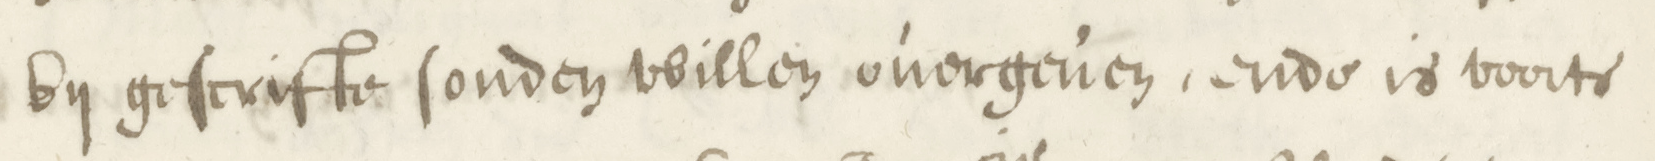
by gescrifte souden willen ouergeuen, ende is voorts
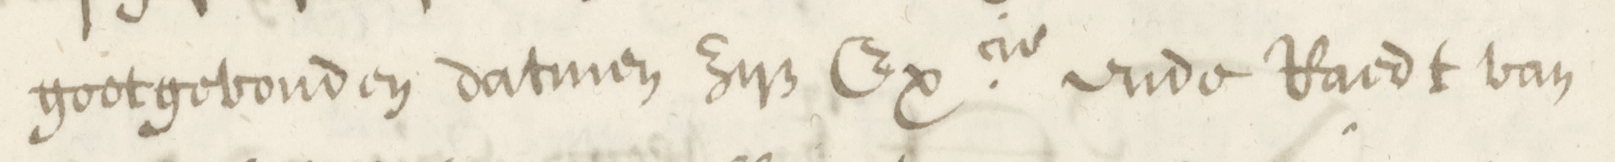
goetgevonden datmen zyn Excie. ende Raedt van
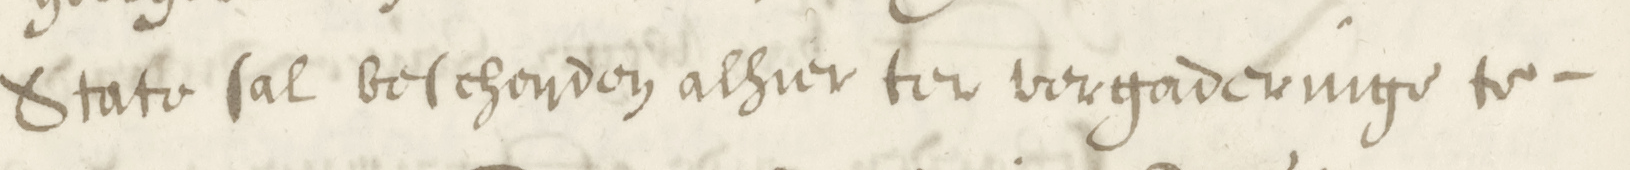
State sal bescheyden alhier ter vergaderinge te
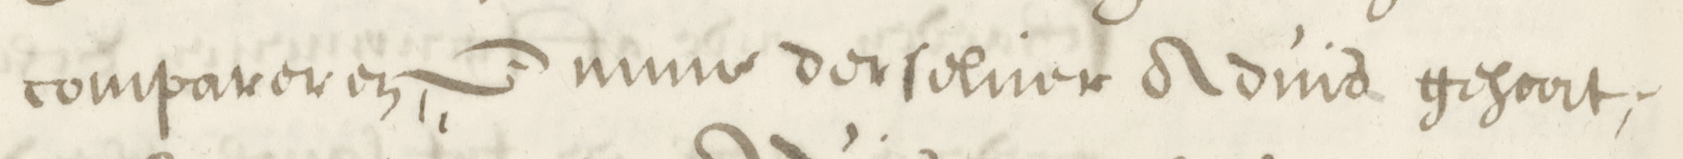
compareren, Omme derseluer Aduis gehoort,-
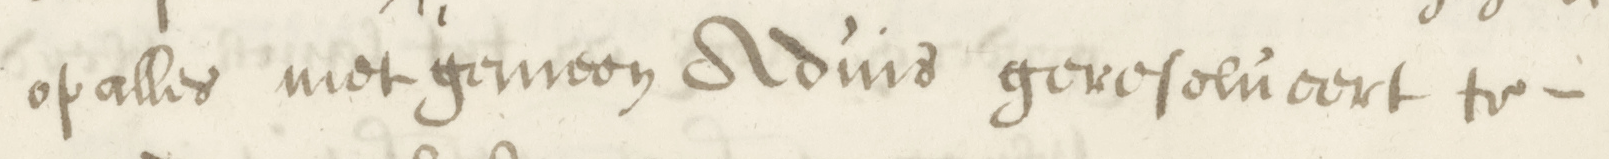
op alles met gemeen Aduis geresolueert te
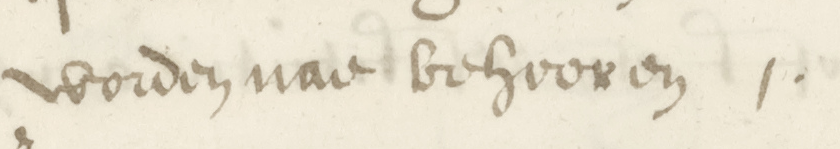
worden nae behooren.
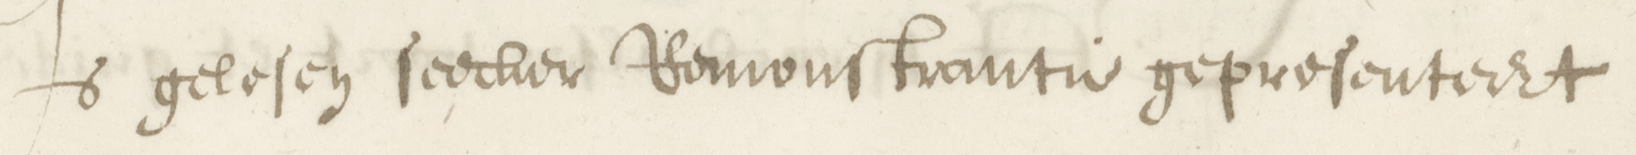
Is gelesen seecker Remonstrantie gepresenteert
